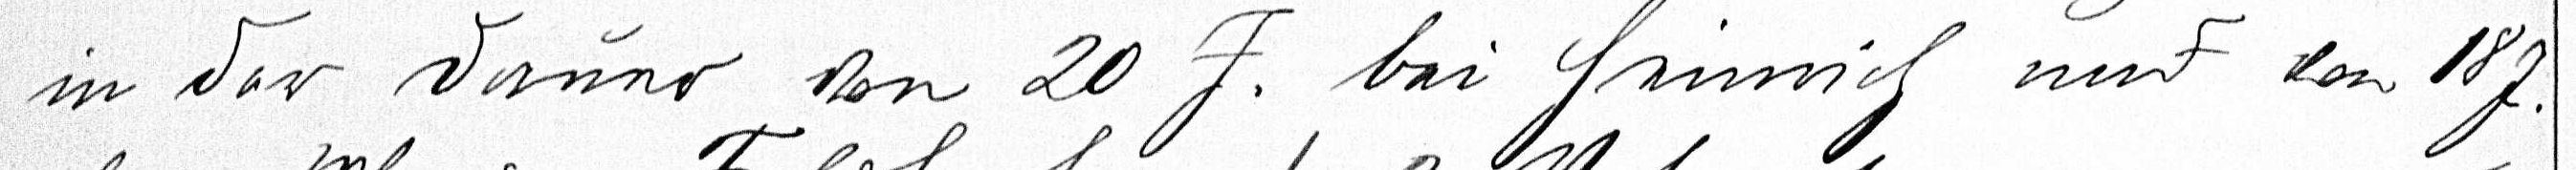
in der Dauer von 20 J. bei Heinrich und von 18 J.
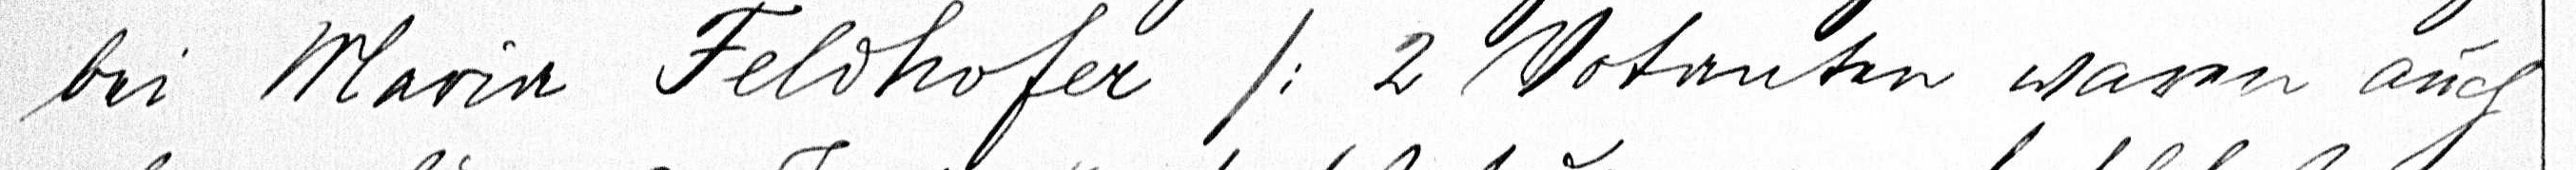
bei Maria Feldhofer (2 Votanten waren auch
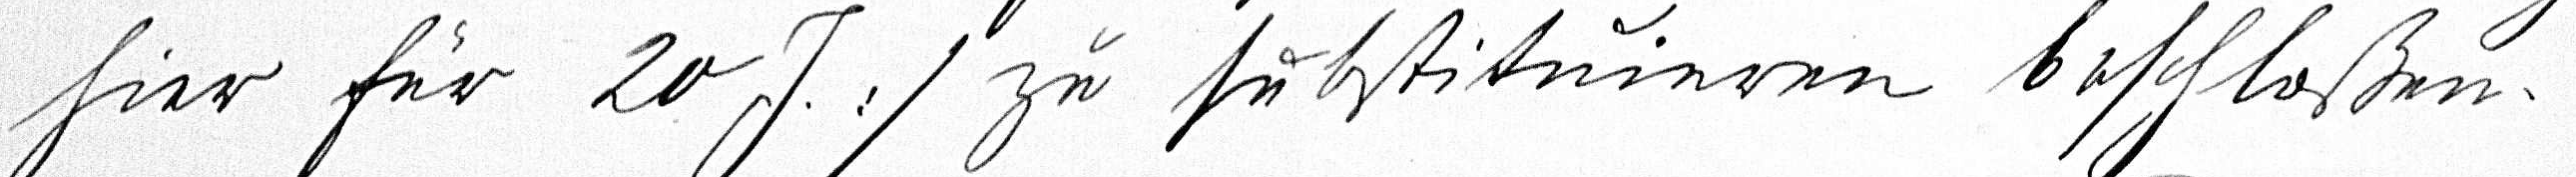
hier für 20 J.) zu substituieren beschloßen.
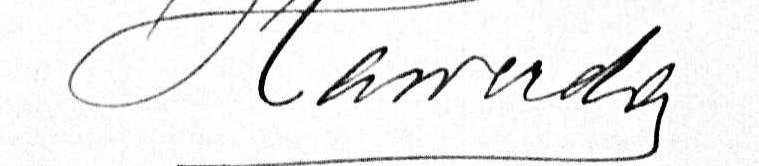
Hawerda
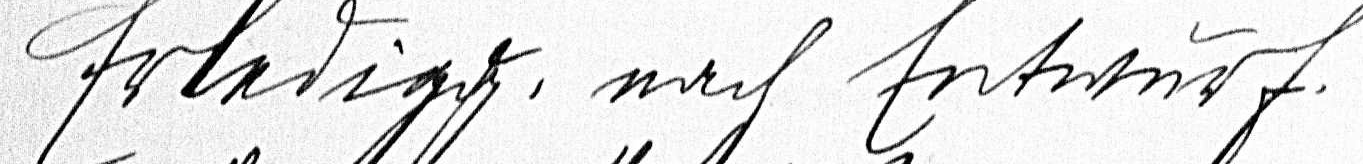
Erledigg, nach Entwurf
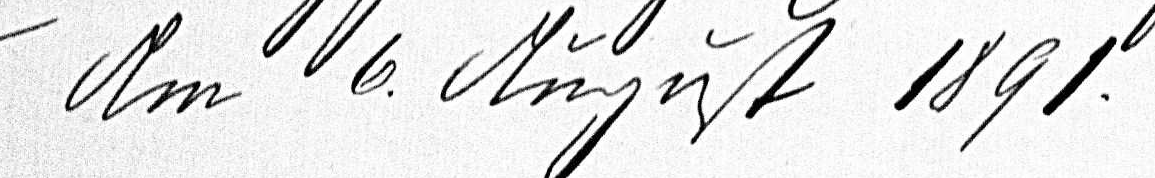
Am 6. August 1891
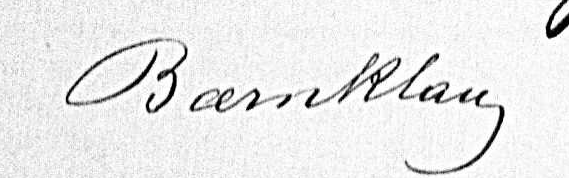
Baernklau
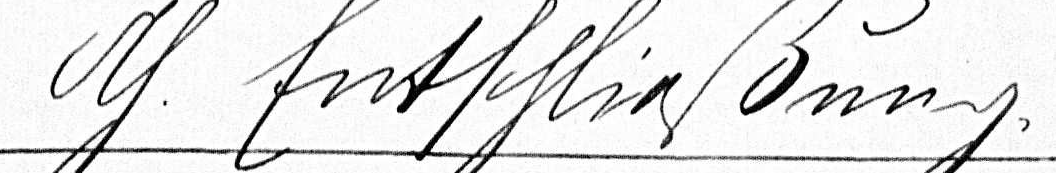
Ah. Entschließung
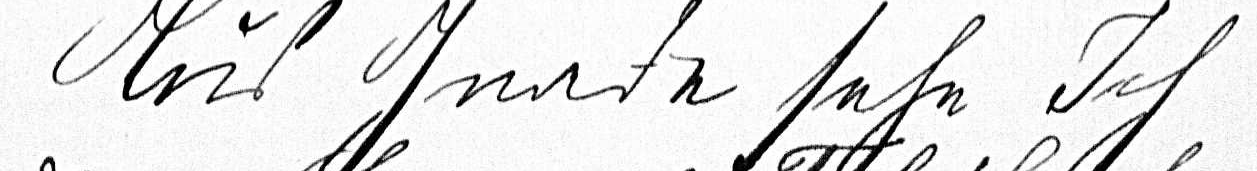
Aus Gnade sehe Ich
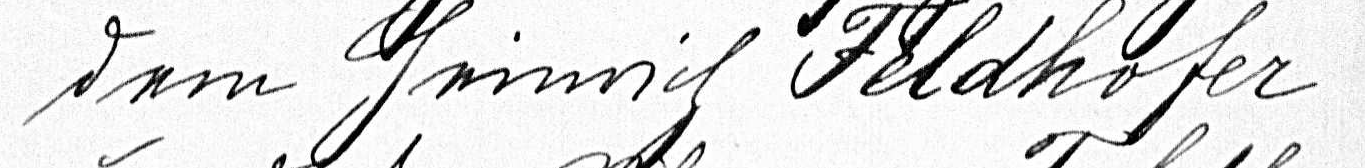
dem Heinrich Feldhofer
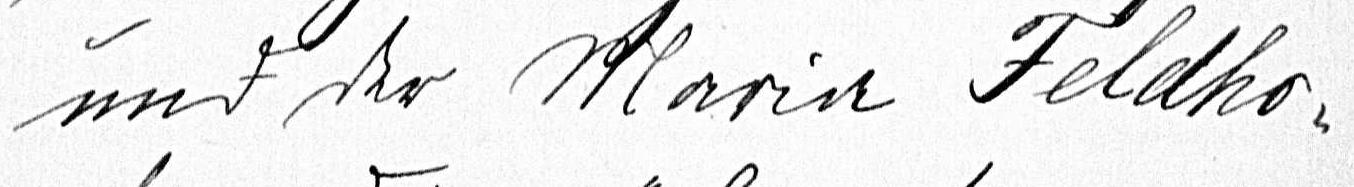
und der Maria Feldho¬
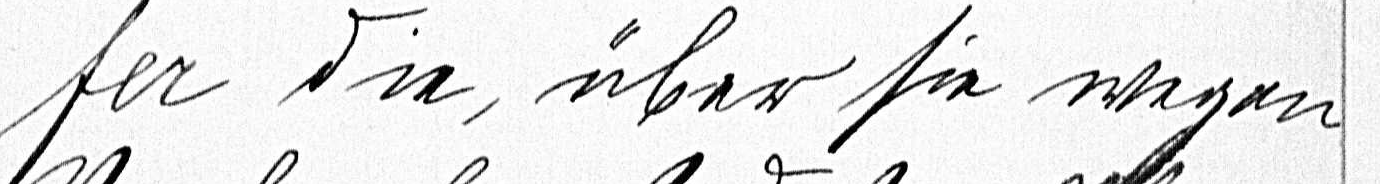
fer die, über sie wegen
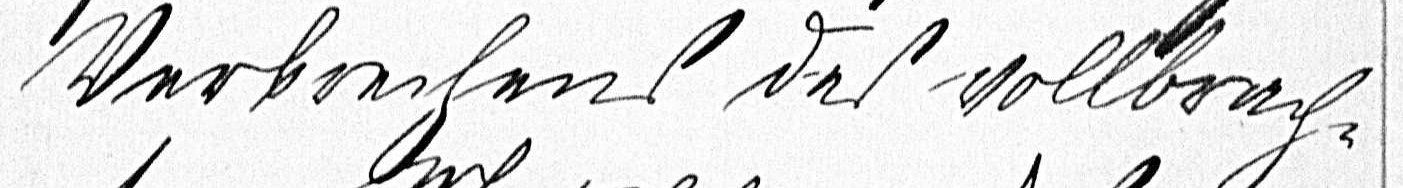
Verbrechens des vollbrach¬
